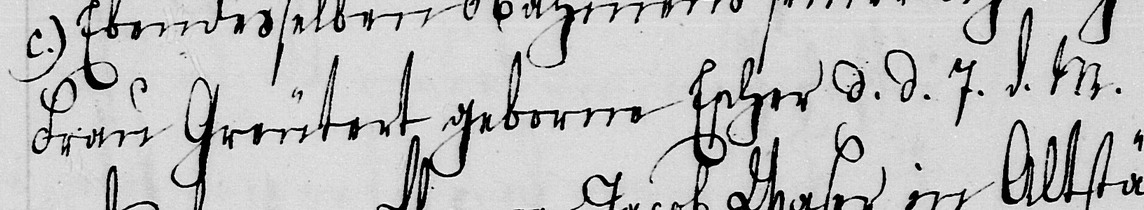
Frau Greutert geborene Escher d. d. 7. d. M.
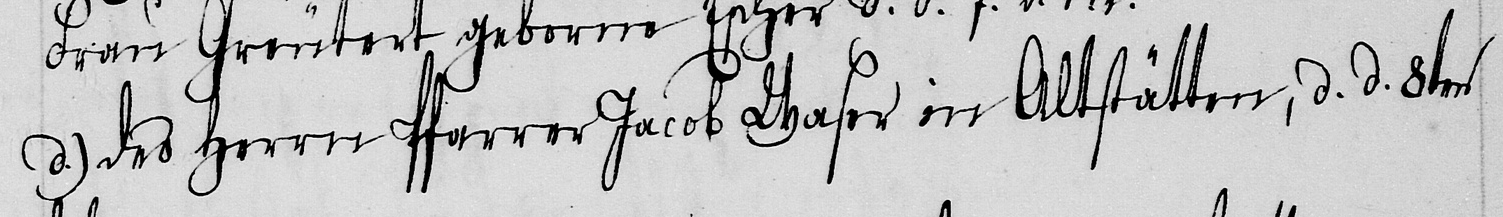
d.) des Herrn Pfarrer Jacob Waser in Altstätten, d. d. 8ten
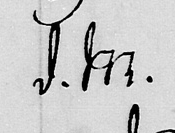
d. M.
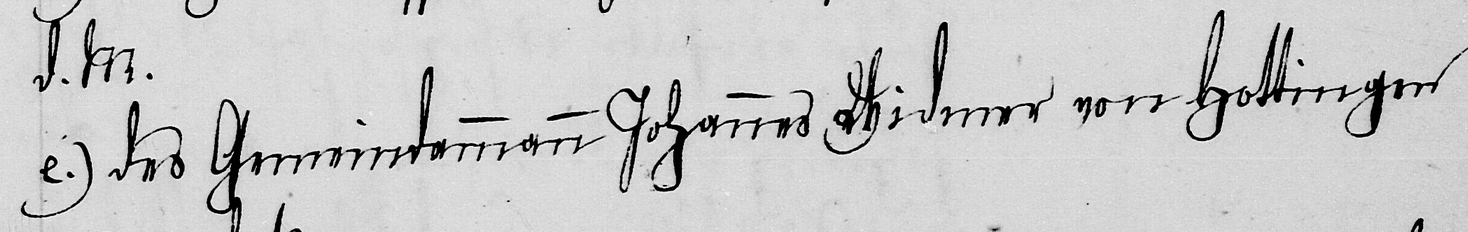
e.) des Gemeindammann Johannes Widmer von Hottingen
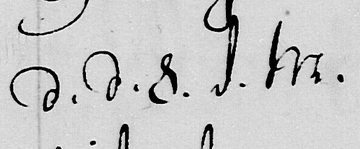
d. d. 8. d. M.
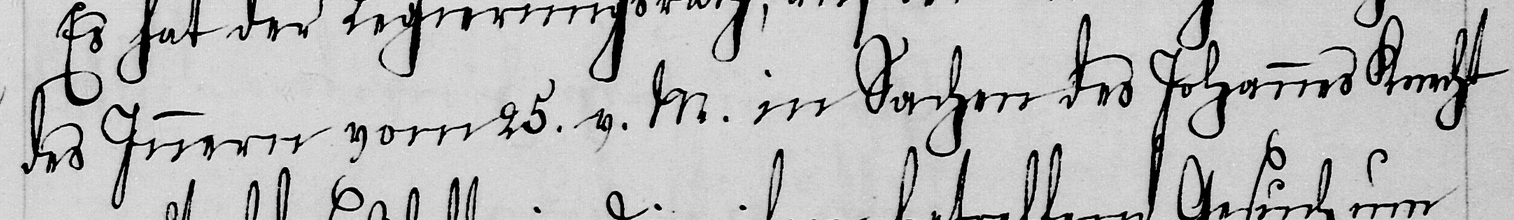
des Innern vom 25. v. M. in Sachen des Johannes Knecht
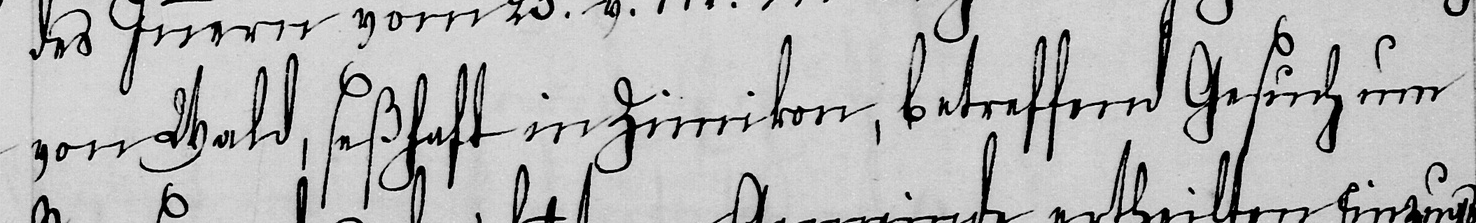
von Wald, seßhaft in Zimikon, betreffend Gesuch um
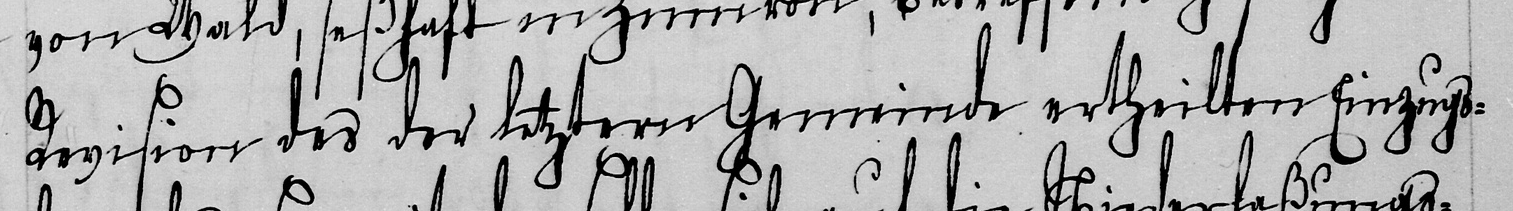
Revision des der letztern Gemeinde ertheilten Einzugs¬
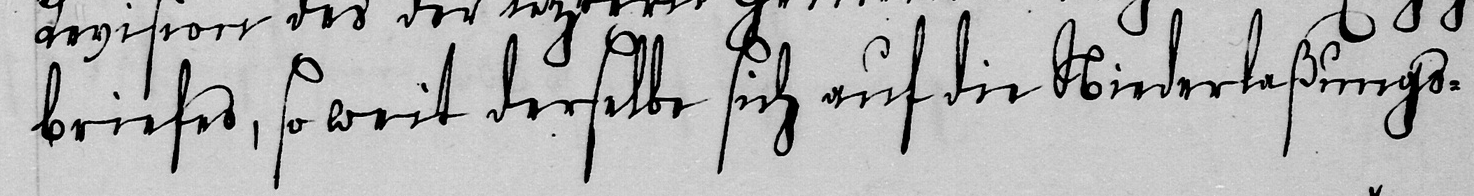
briefes, so weit derselbe sich auf die Niederlaßungs-
